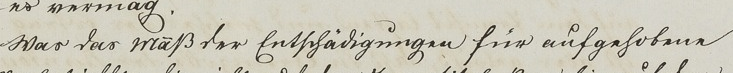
Was das Maaß der Entschädigungen für aufgehobene
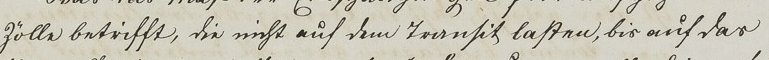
Zölle betrifft, die nicht auf dem Transit lasten, bis auf das
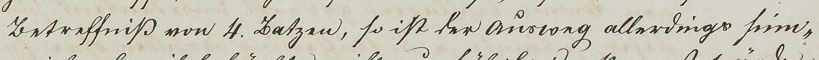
Betreffniß von 4. Batzen, so ist der Ausweg allerdings sinn-
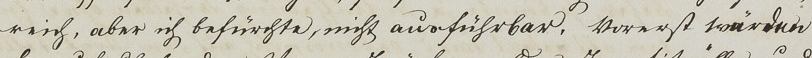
reich, aber ich befürchte, nicht ausführbar. Vorerst würden
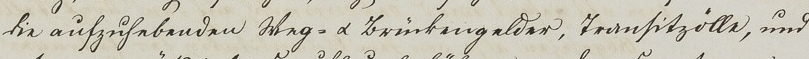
die aufzuhebenden Weg- & Brückengelder, Transitzölle, und
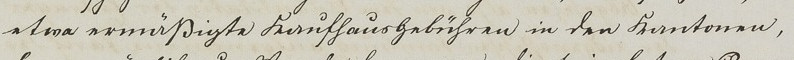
etwa ermäßigte Kaufhausgebühren in den Kantonen,
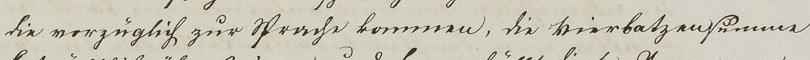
die vorzüglich zur Sprache kommen, die Vierbatzensumme
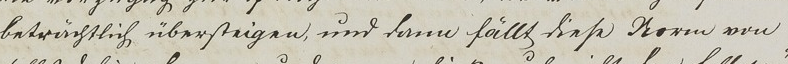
beträchtlich übersteigen, und dann fällt diese Norm von
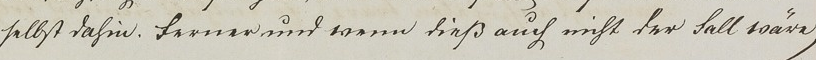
selbst dahin. Ferner und wenn dieß auch nicht der Fall wäre
